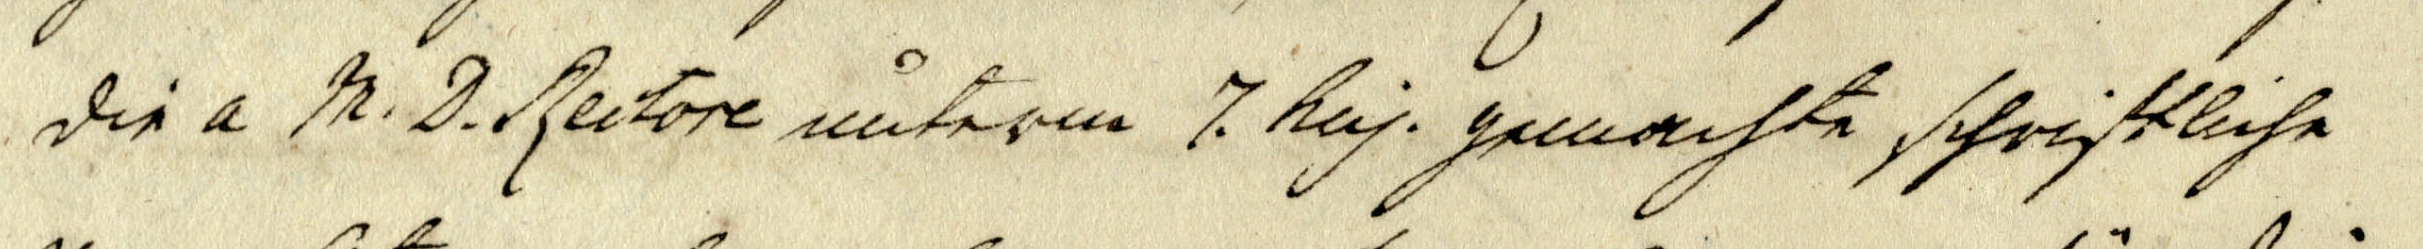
die a M. D. Rectore unterm 7. huj. gemachte schriftliche
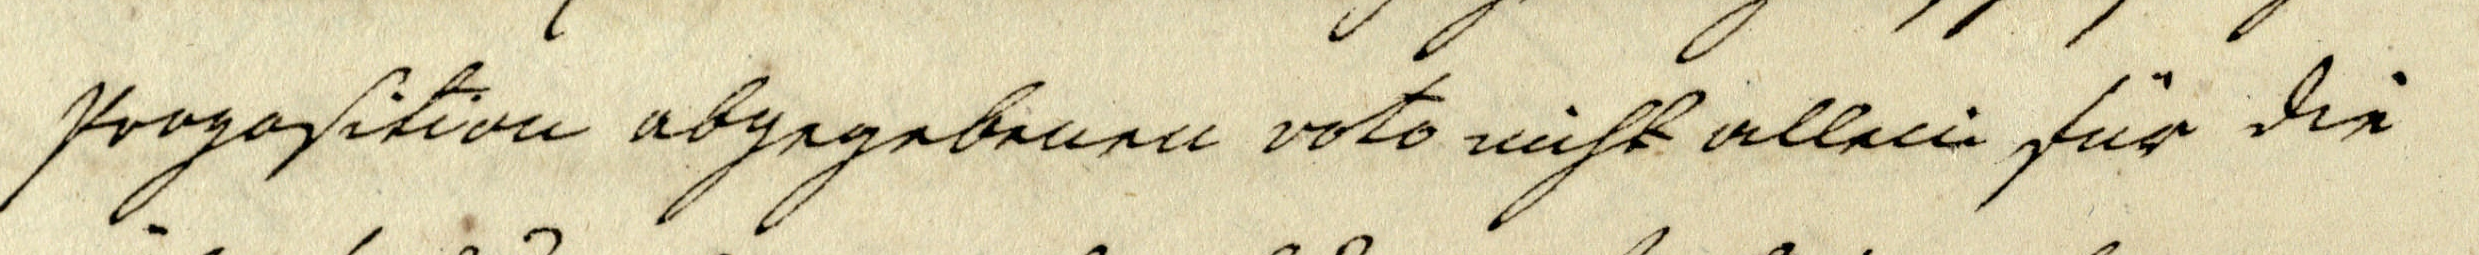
Proposition abgegebenen voto nicht allein für die
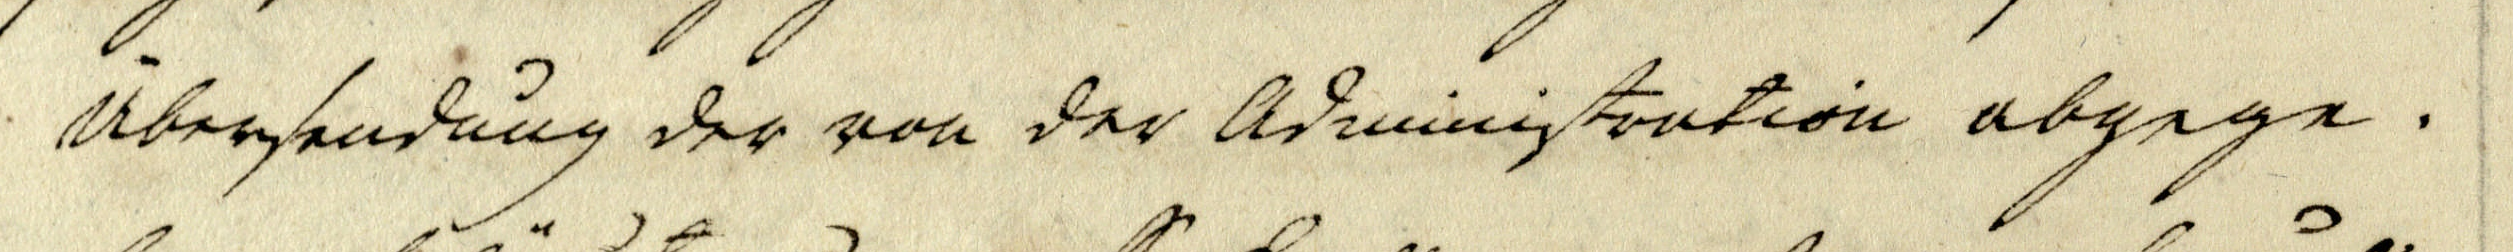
Übersendung der von der Administration abgege¬
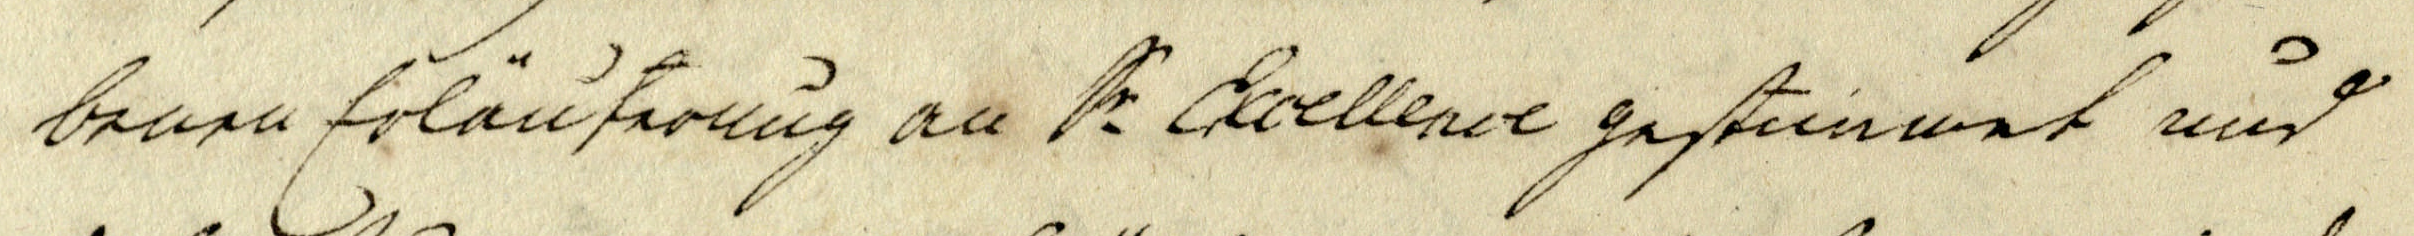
benen Erläuterung an Sr Excellence gestimmet und
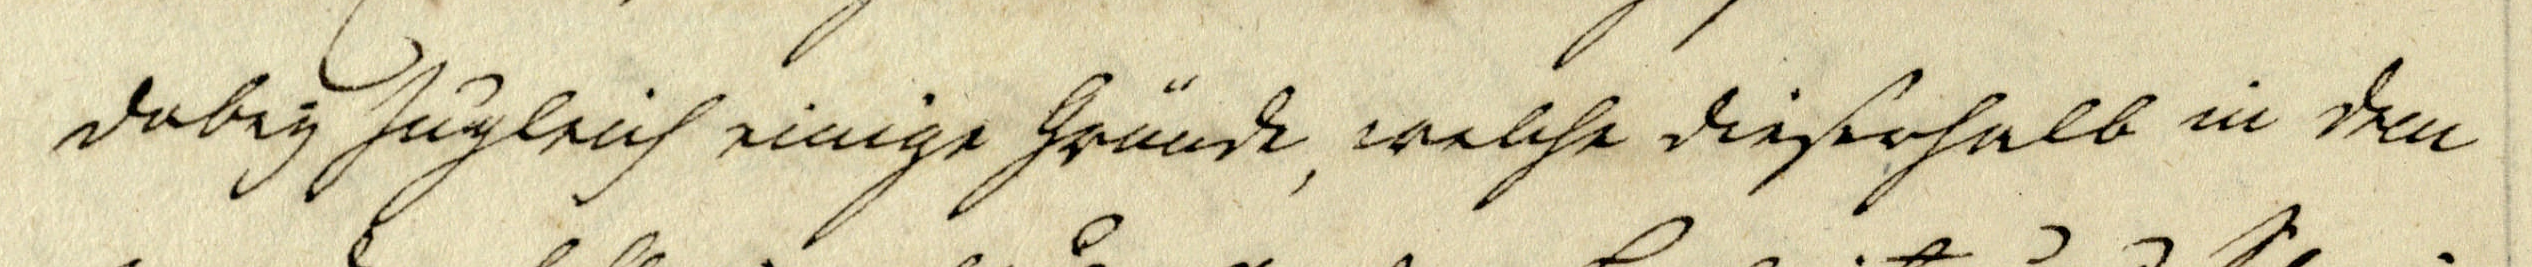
dabeÿ zugleich einige Gründe, welche dieserhalb in dem
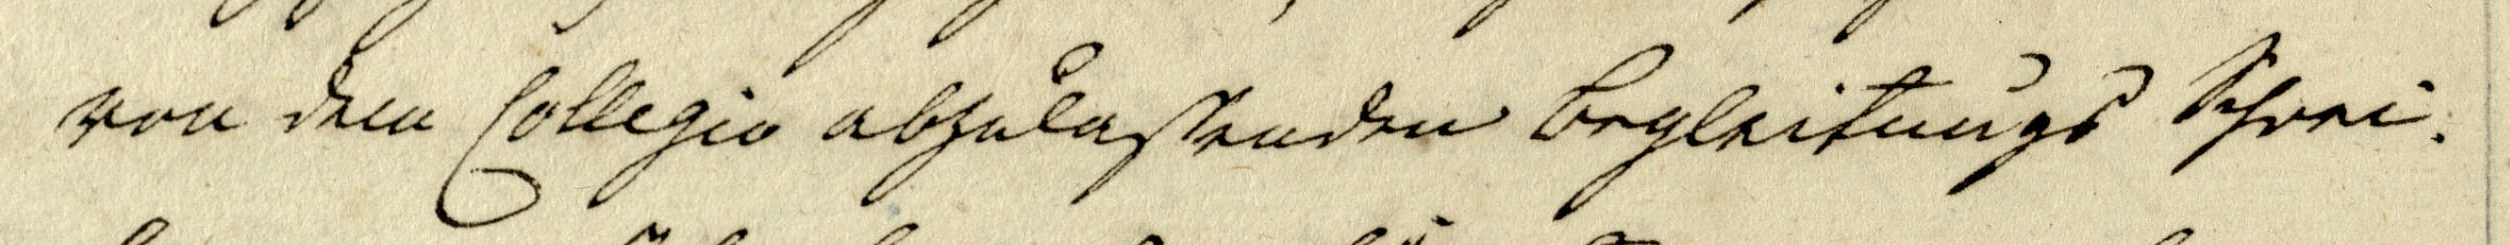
von dem Collegio abzulassenden Begleitungs Schrei¬
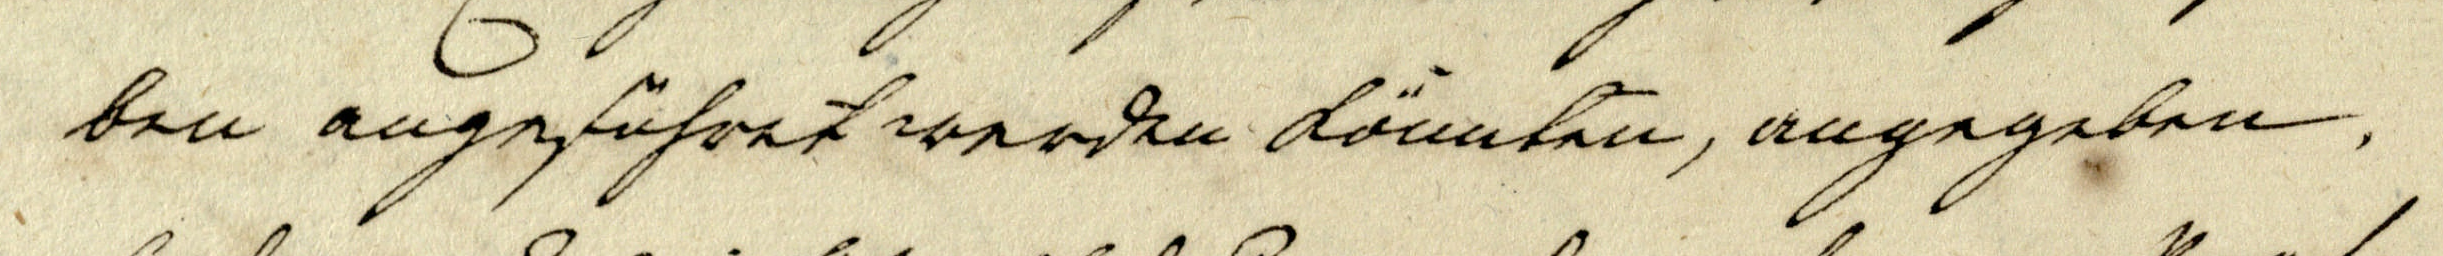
ben angeführet werden könnten, angegeben,
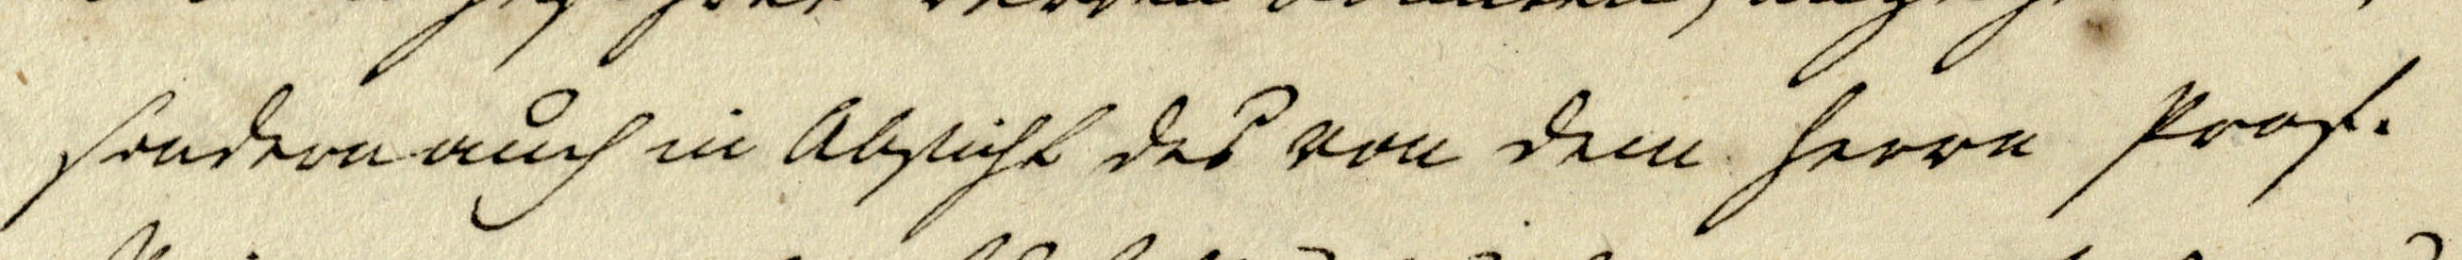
sondern auch in Absicht des von dem Herrn Prof.
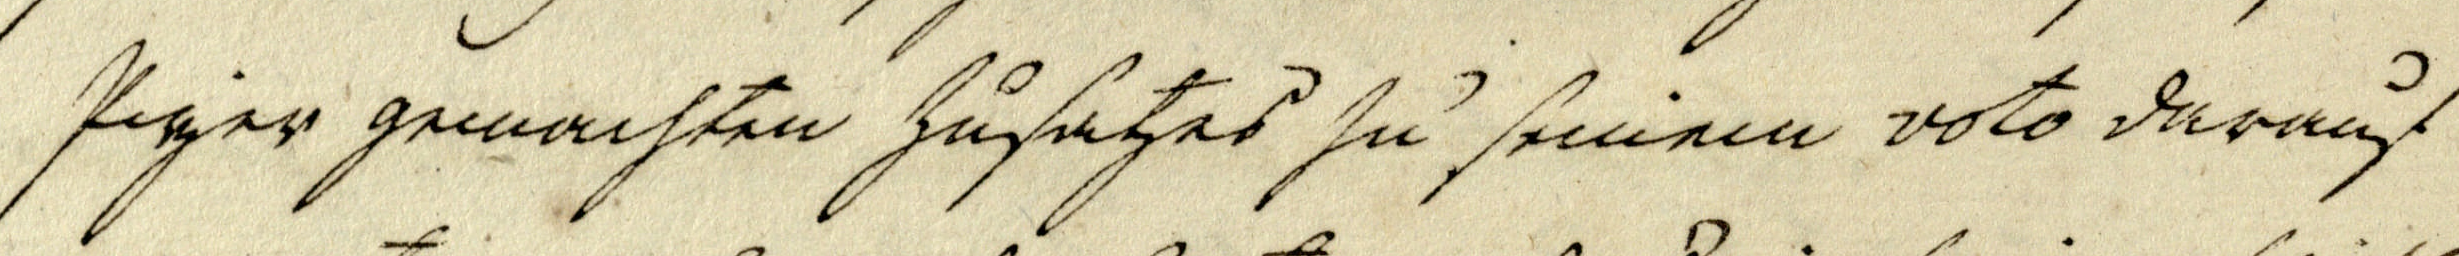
Piper gemachten Zusatzes zu seinem voto darauf
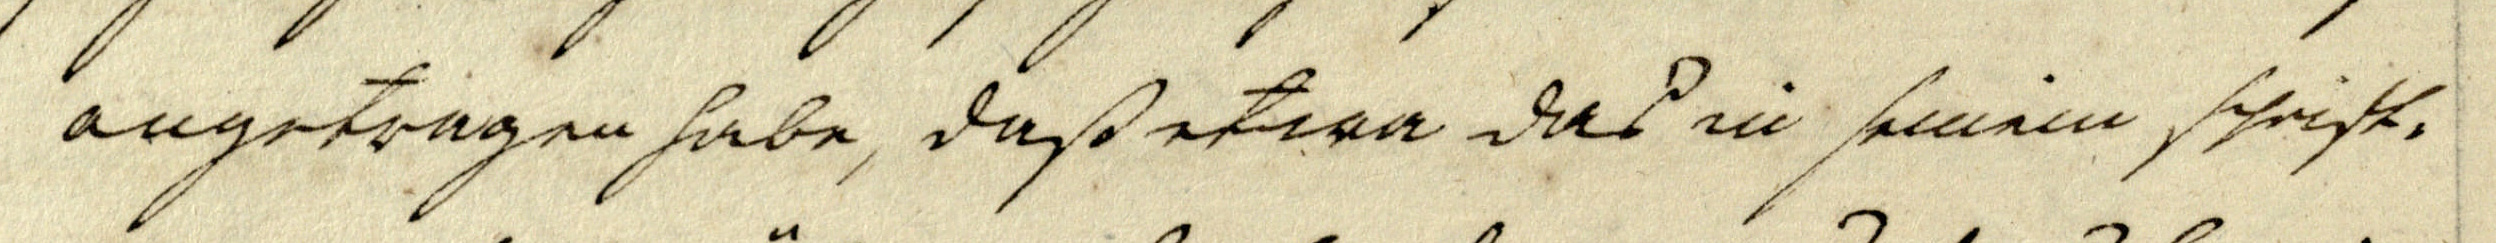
angetragen habe, daß etwa das in seinem schrift¬
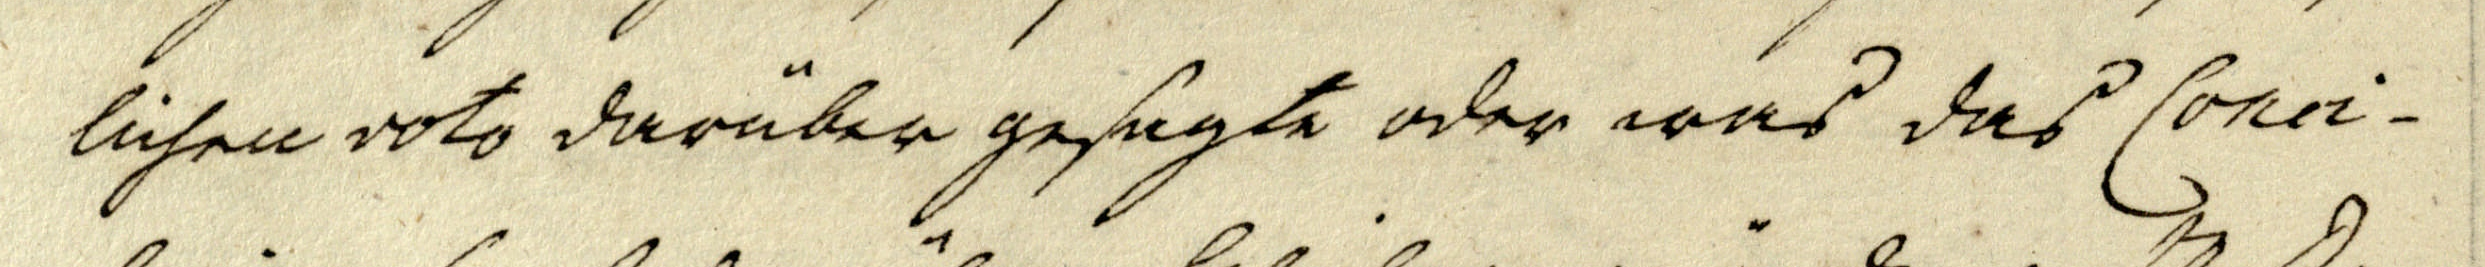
lichen voto darüber gesagte oder was das Conci¬
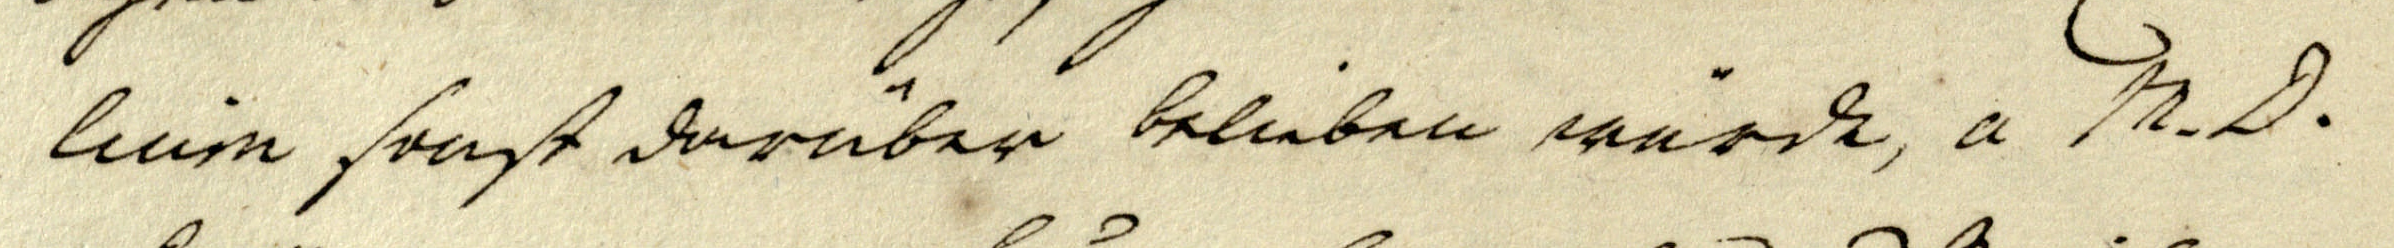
lium sonst darüber belieben würde, a M. D.
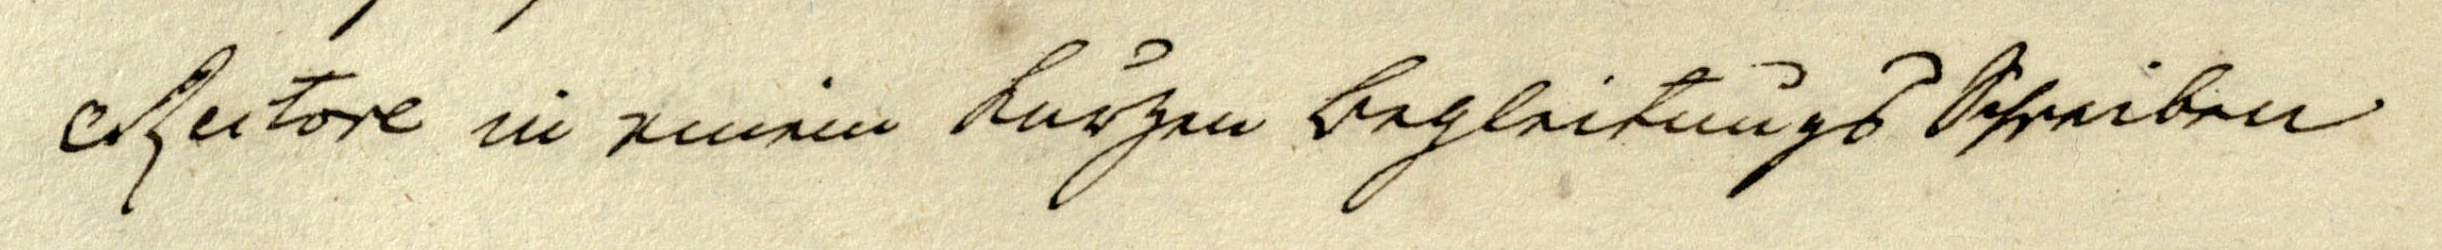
Rectore in einem kurzen Begleitungs Schreiben
